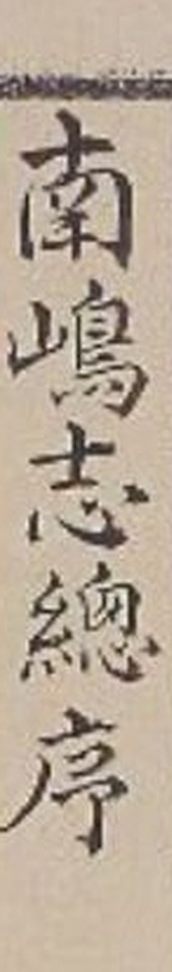南島志総序
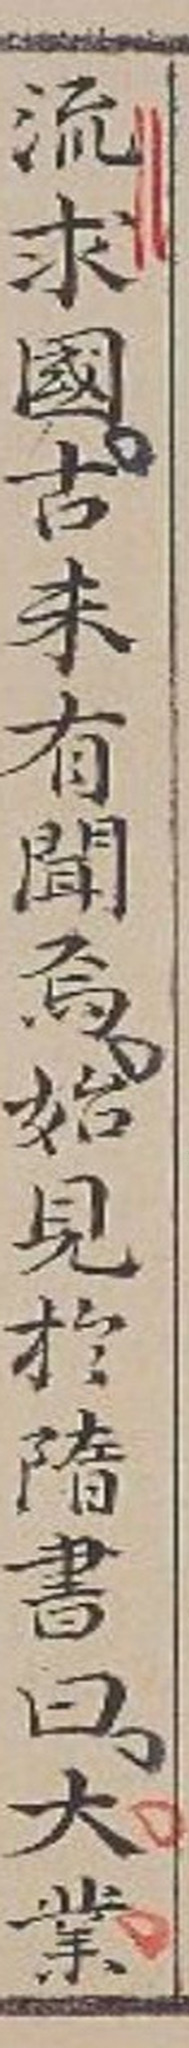流求国。古未有聞焉。始見於隋書曰。大業
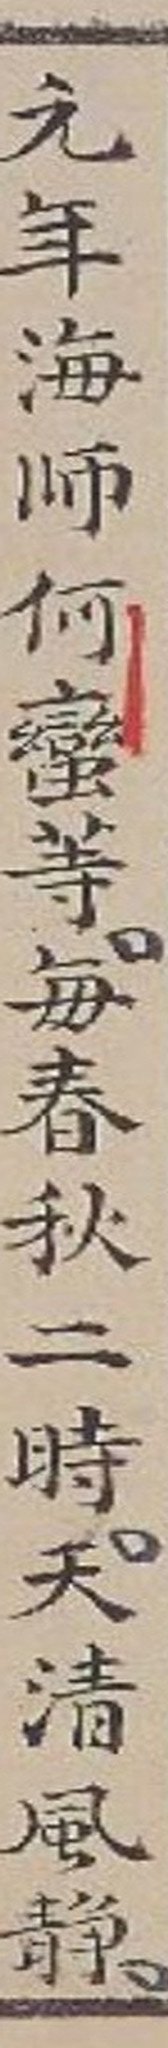元年海師何蛮等。毎春秋二時。天清風静。
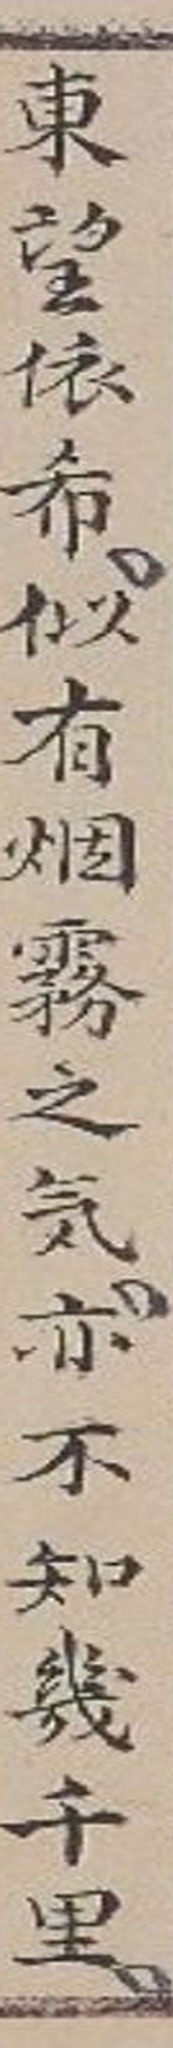東望依希。似有煙霧之気。亦不知幾千里。
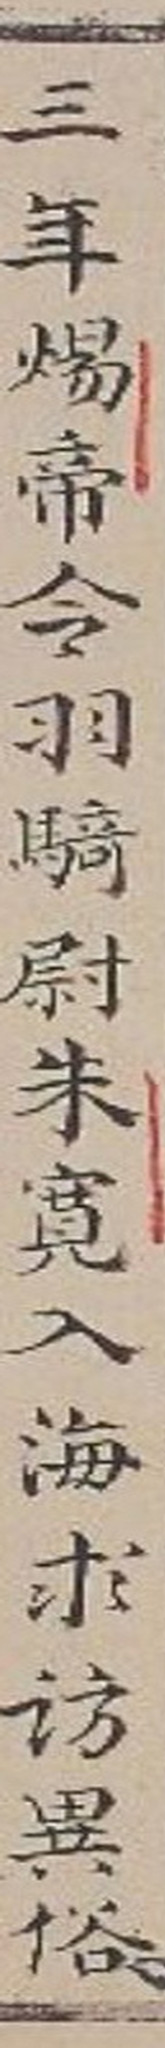三年煬帝令羽騎尉朱寛入海求訪異俗。
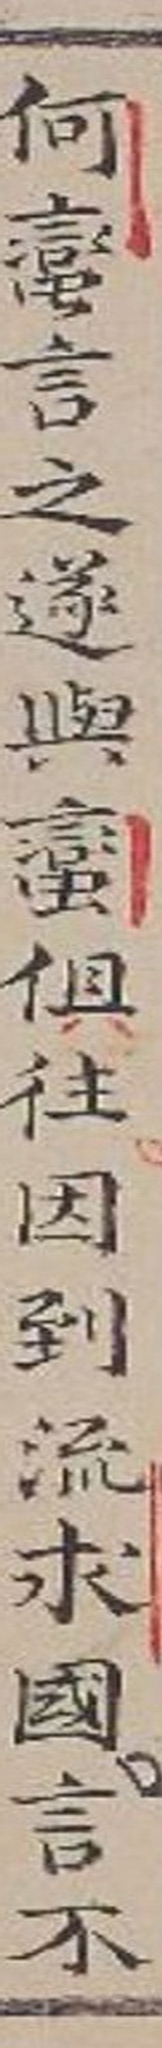何蛮言之遂与蛮俱往。因到流求国。言不
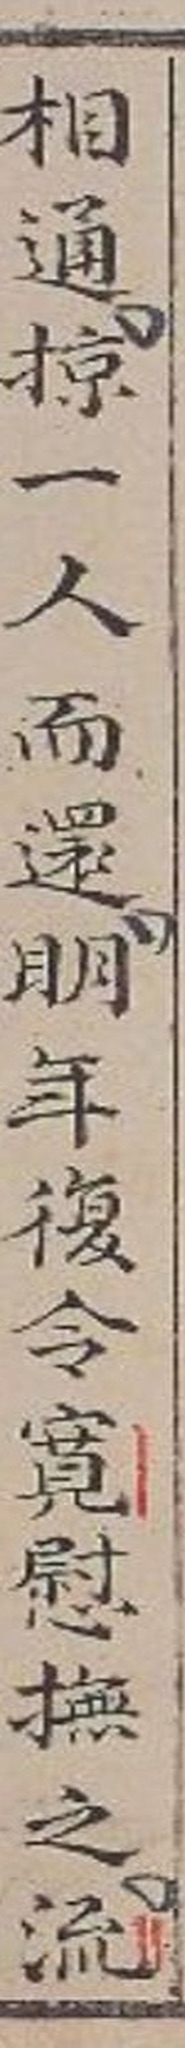相通。掠一人而還。眀年復令寛慰撫之。流
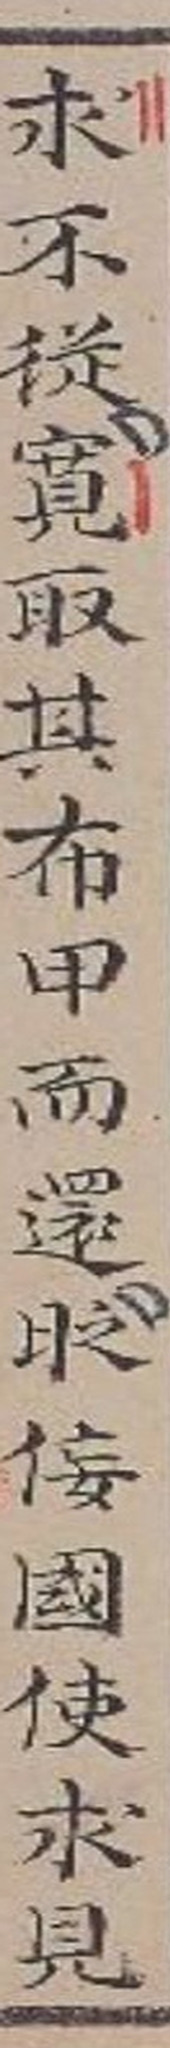求不従。寛取其布甲而還。時侫倭国使求見

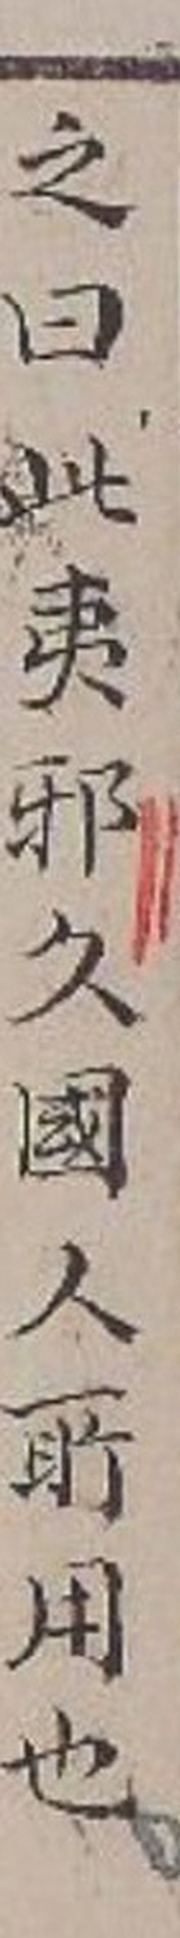之曰此夷邪久国人所用也。
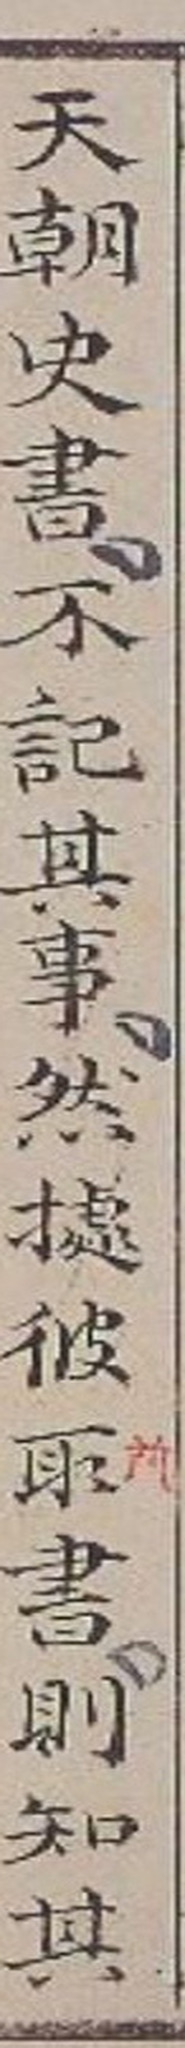天朝史書。不記其事。然拠彼取所書。則知其
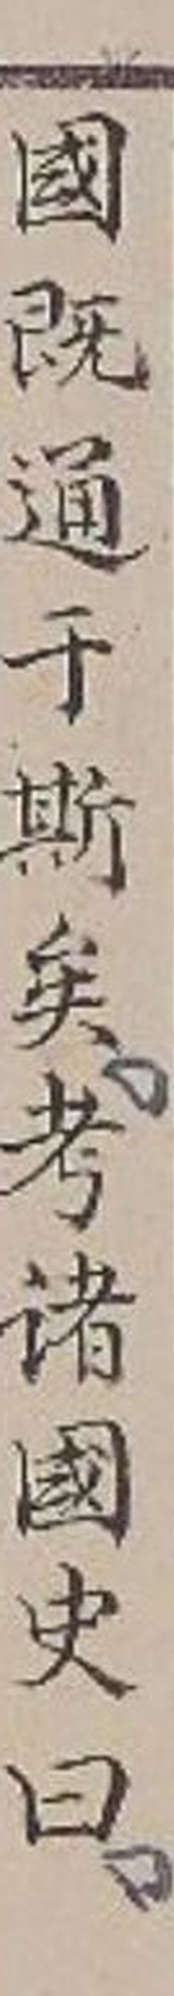国既通于斯矣。考諸国史曰。
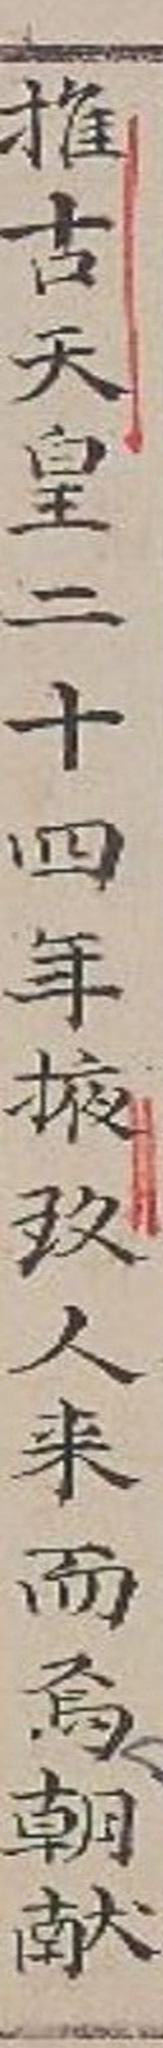推古天皇二十四年掖玖人来而焉。朝献
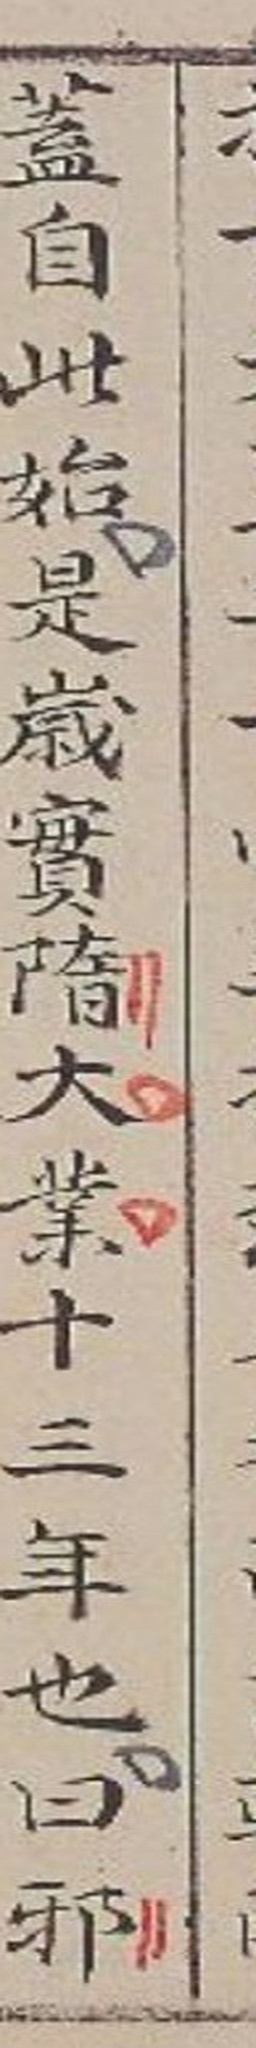蓋自此始。是歳実隋大業十三年也。曰邪
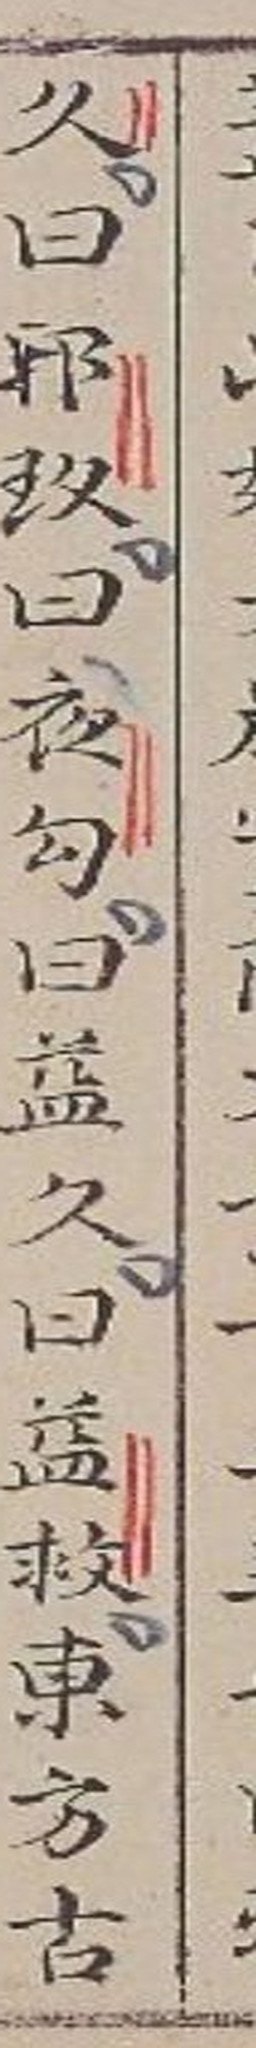久。曰邪玖。曰夜勾。曰益久。曰益救。東方古
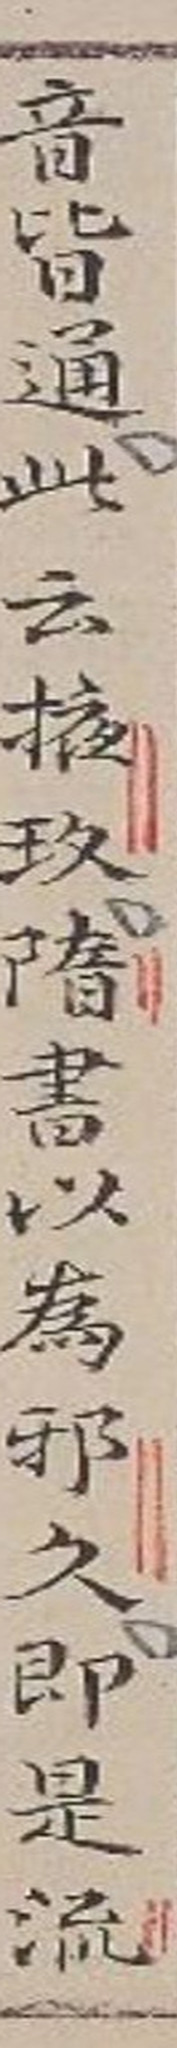音皆通。此云掖玖。隋書以為邪久。即是流
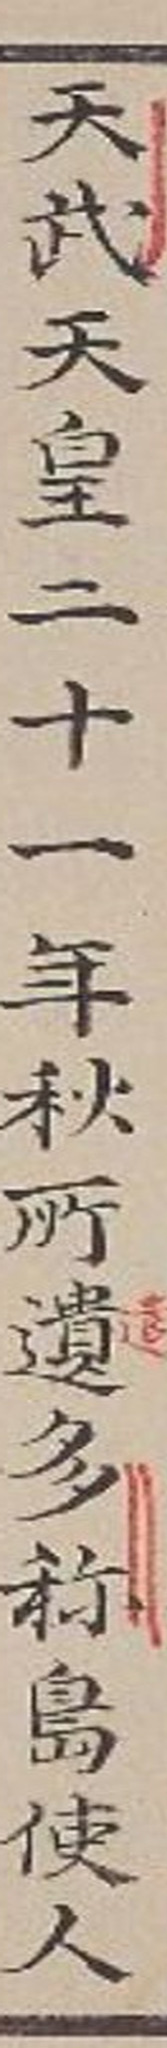天武天皇二十一年秋所遺遣多称島使人
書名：南島志 全
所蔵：University of the Ryukyus Library
